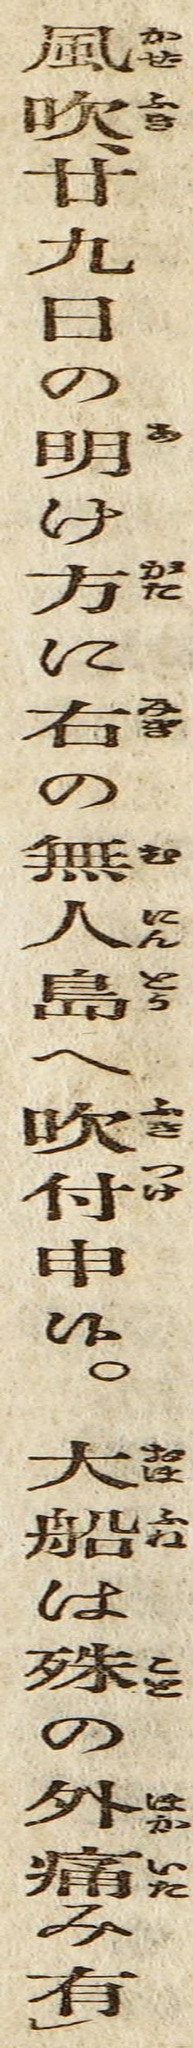風吹、廿九日の明け方に右の無人島へ吹付申候。大船は殊の外痛み有
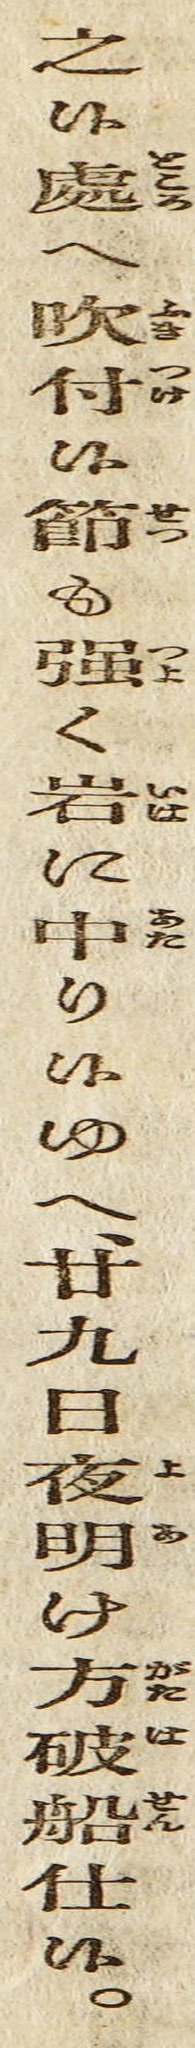之候処へ吹付候節も強く岩に中り候ゆへ、廿九日夜明け方破船仕候。
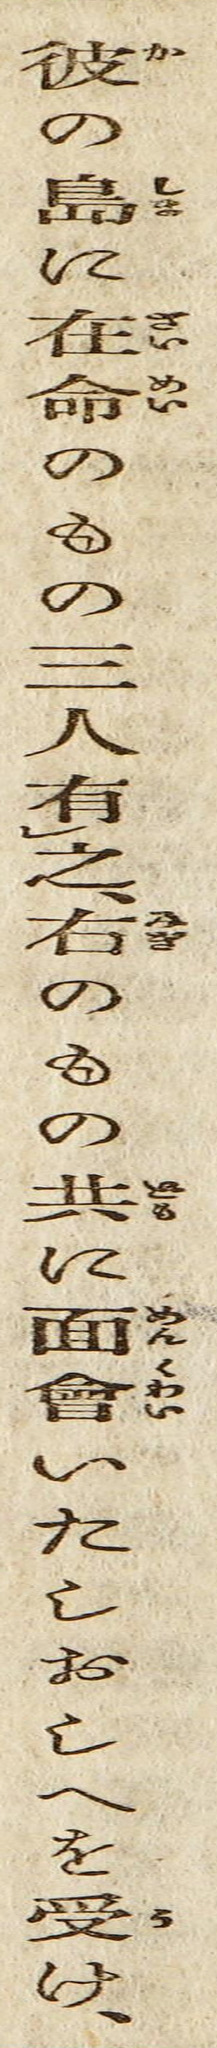彼の島に在命のもの三人有之、右のもの共に面会いたしおしへを受け、
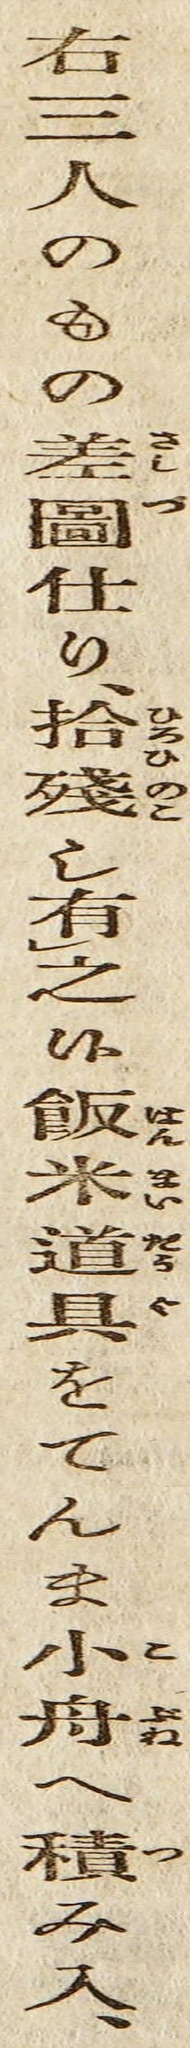右三人のもの差図仕り、拾残し有之候飯米道具をてんま小舟へ積み入、
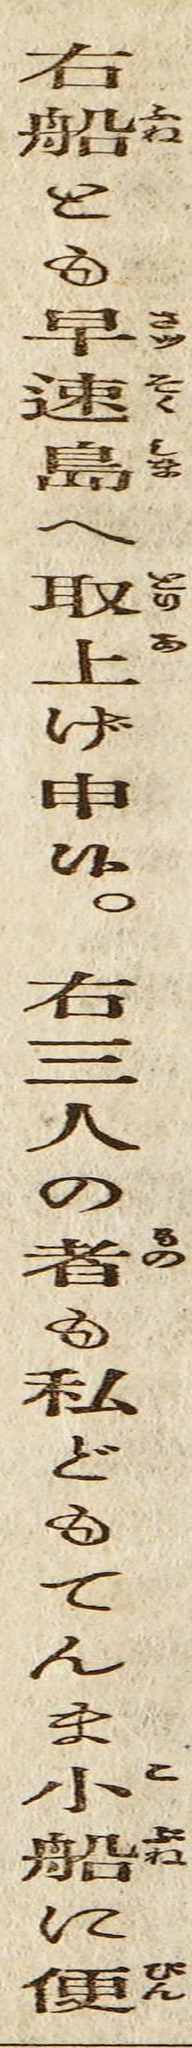右船とも早速島へ取上げ申候。右三人の者も私どもてんま小船に便
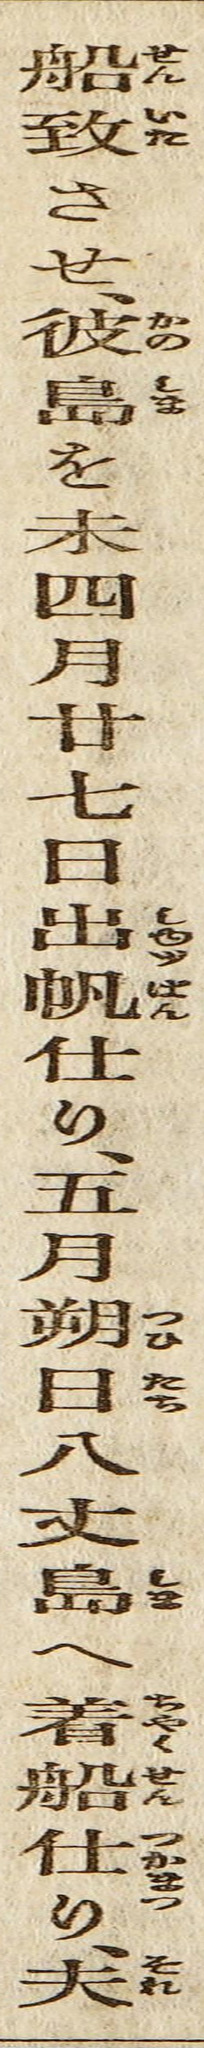船致させ、彼島を未四月廿七日出帆仕り、五月朔日八丈島へ着船仕り、夫
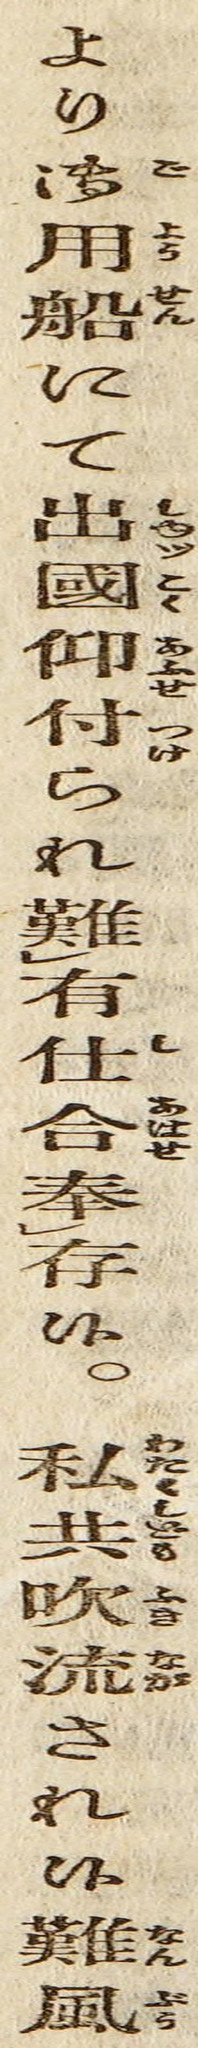より御用船にて出国仰付られ難有仕合奉存候。私共吹流され候難風
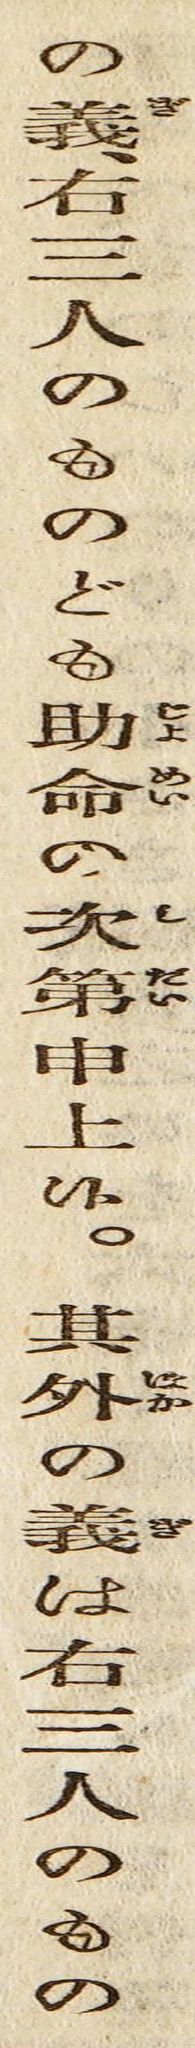の義、右三人のものども助命の次第申上候。其外の義は右三人のもの
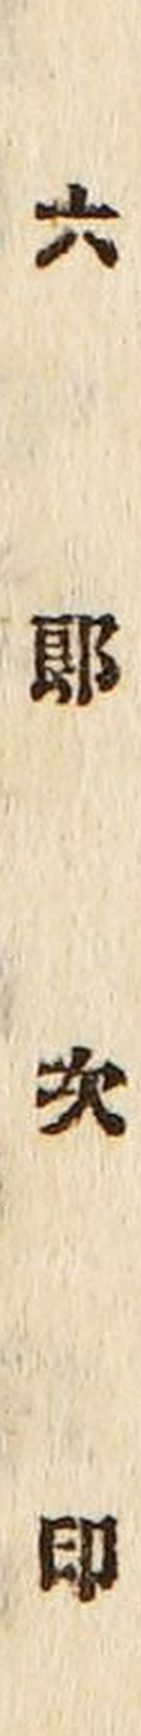六郎次印
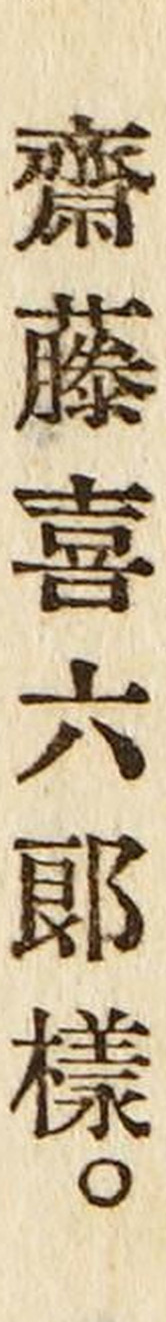斎藤喜六郎様。
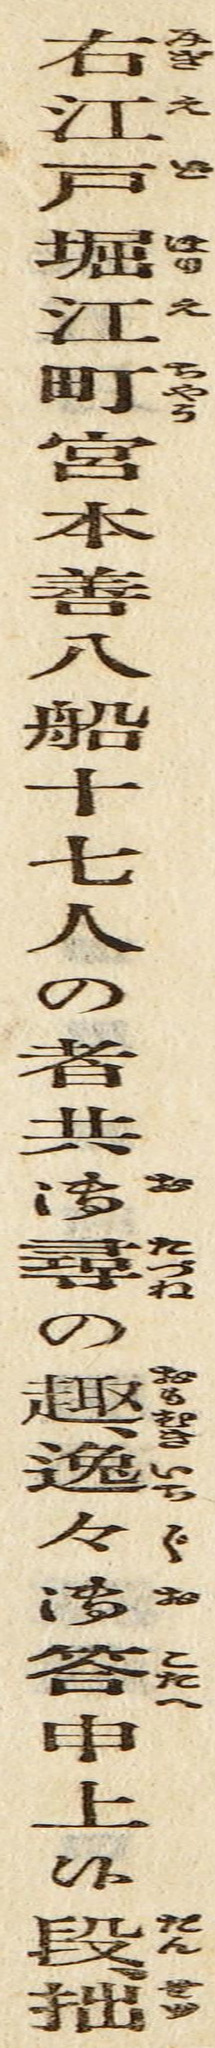右江戸堀江町宮本善八船十七人の者共御尋の趣、逸々御答申上候段、拙
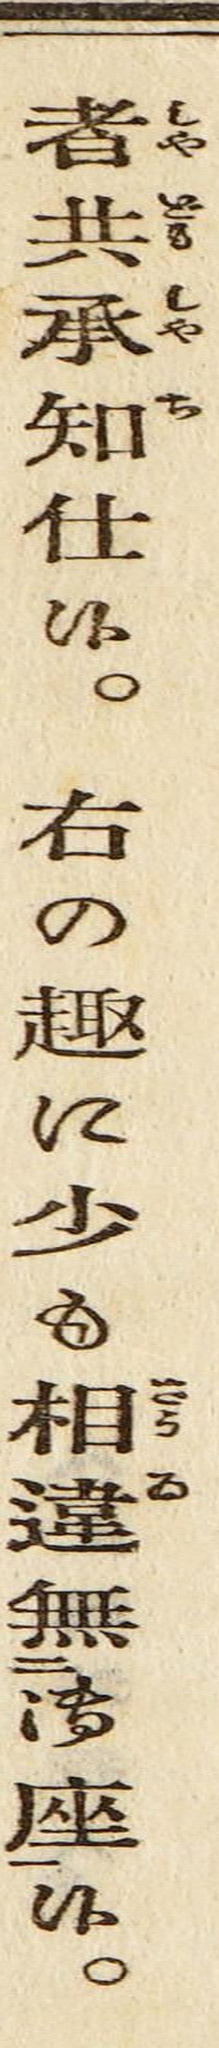者共承知仕候。右の趣に少も相違無御座候。

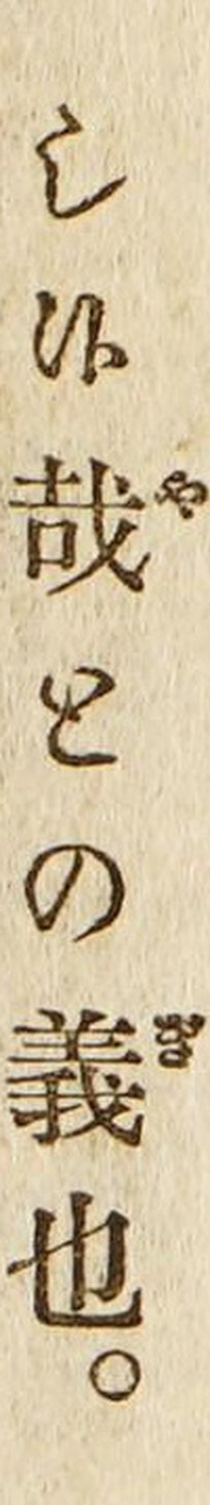し候哉との義也。
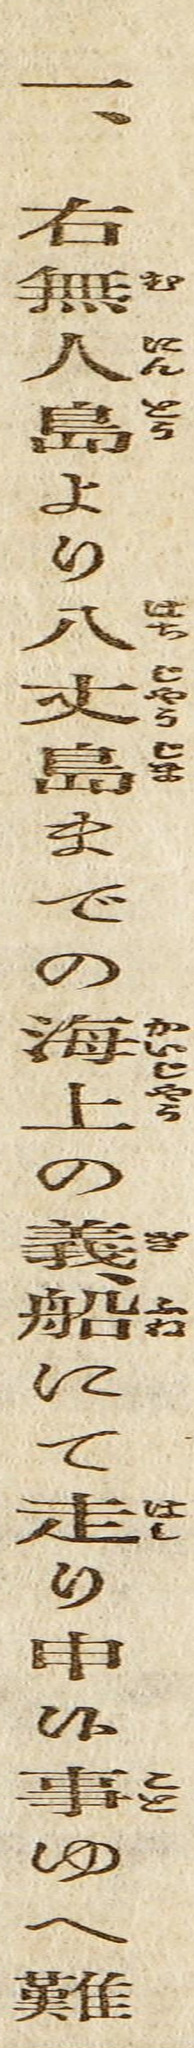一、右無人島より八丈島までの海上の義、船にて走り申候事ゆへ難
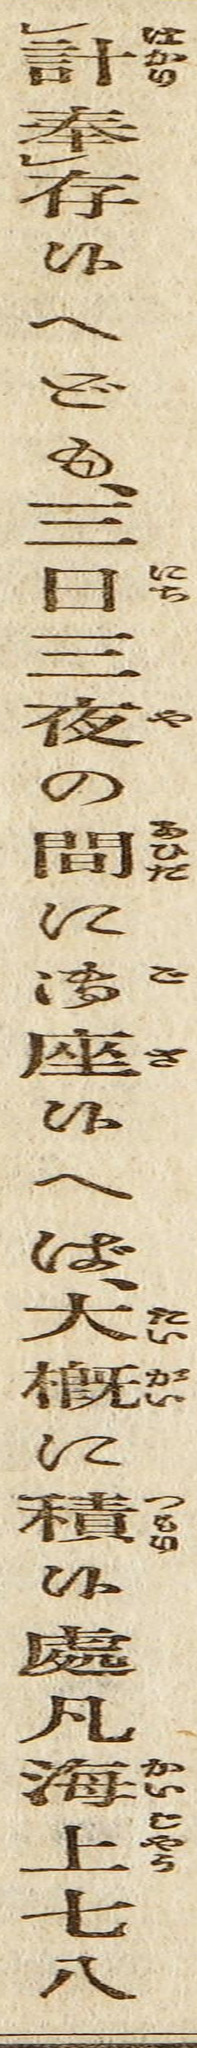計奉存候へども、三日三夜の間に御座候へば、大概に積候処凡海上七八
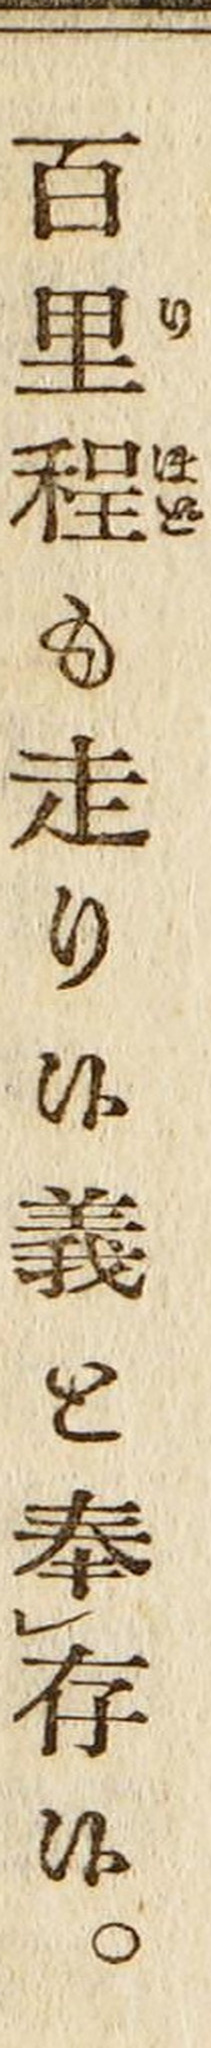百里程も走り候義と奉存候。
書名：日本漂流譚
